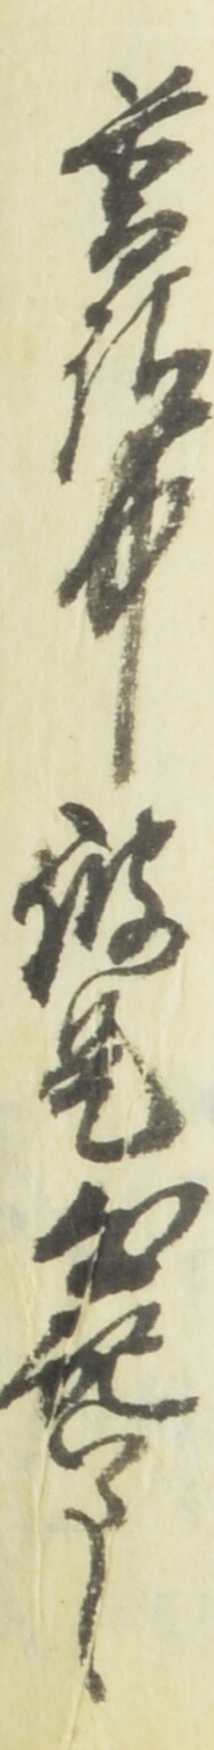普請中彼是心配いたし
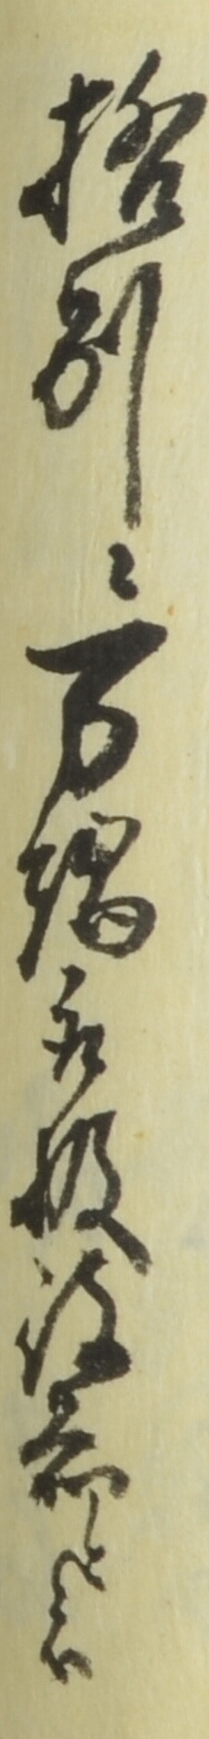格別ニ万端取扱役所とは
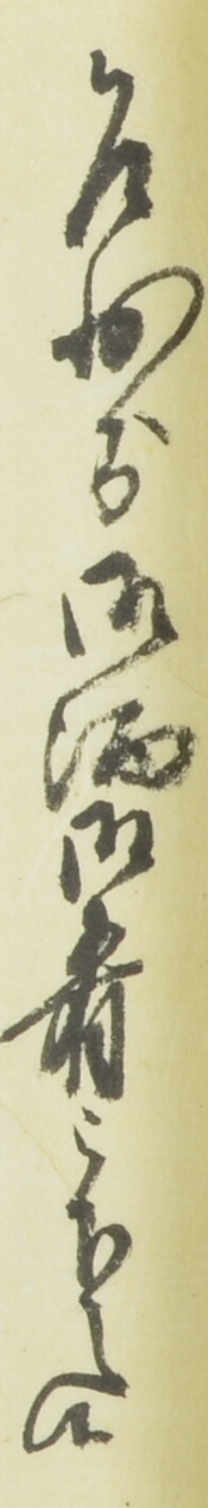乍少分御酒御肴被下之候
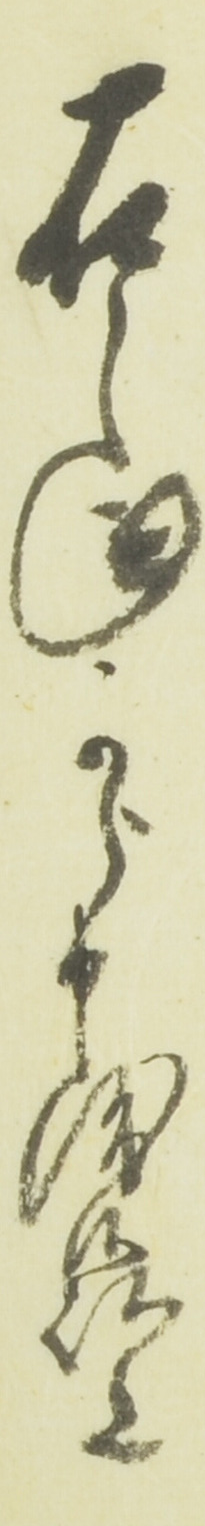右之趣可被申渡候以上
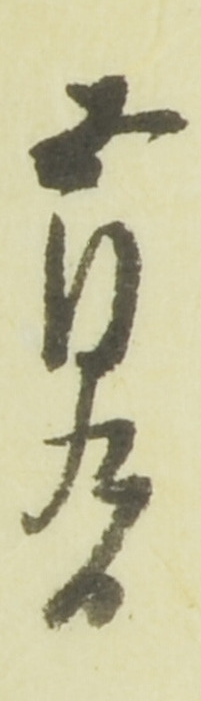五月九日
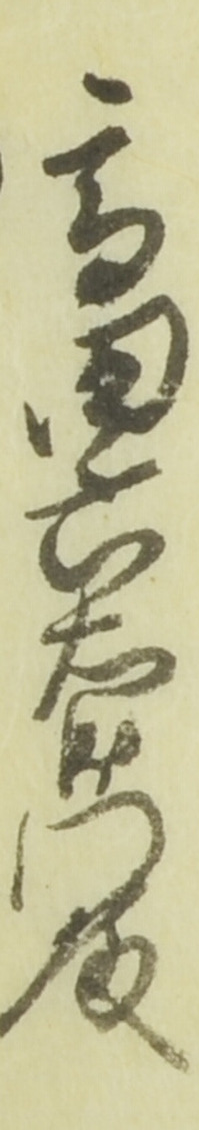高田六右衛門殿
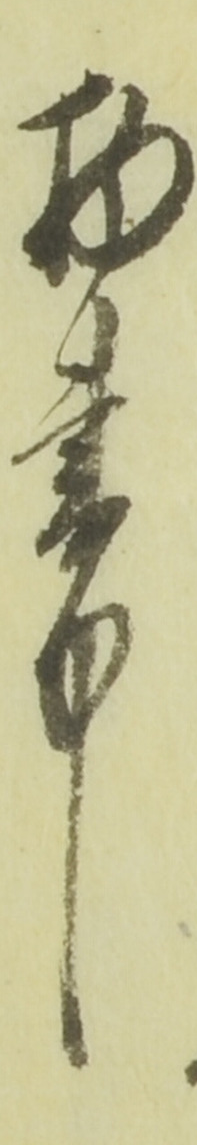物書中
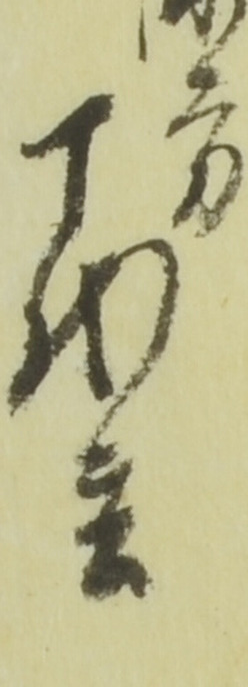丁代共
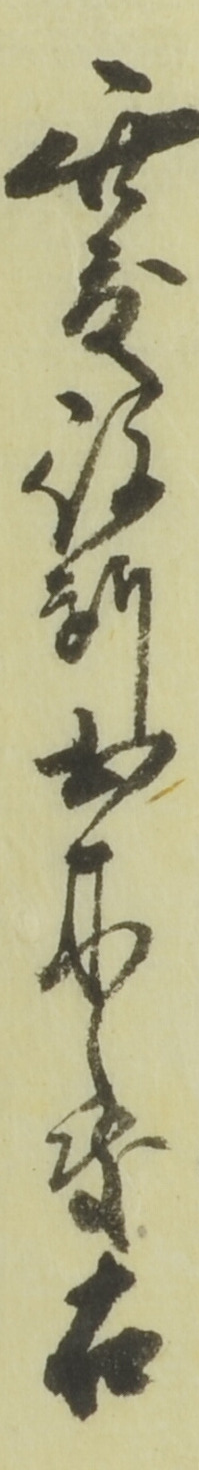此度役所出来之処右
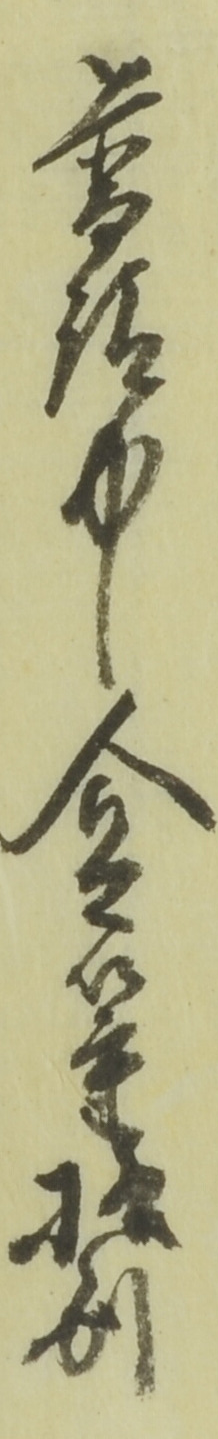普請中人足等格別
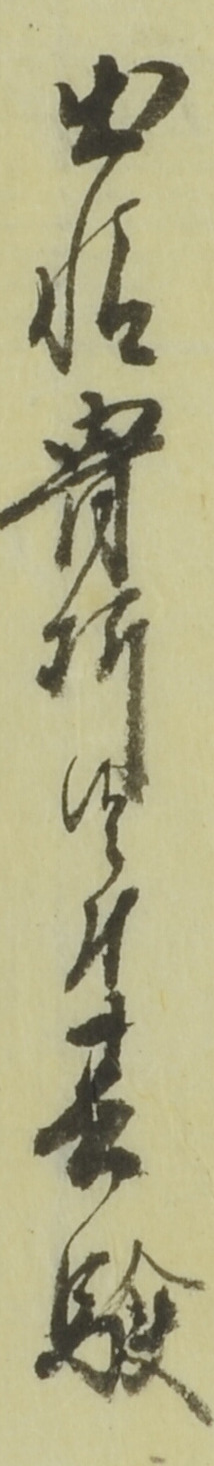出精骨折候ニ付其験
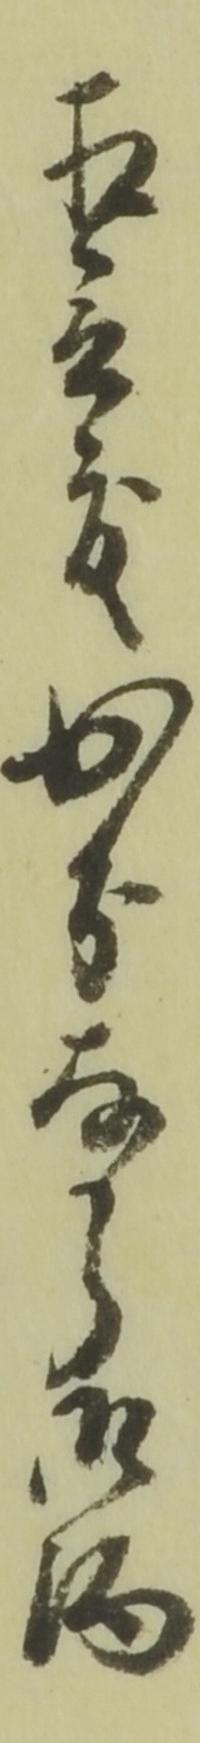相言度少分なから御酒
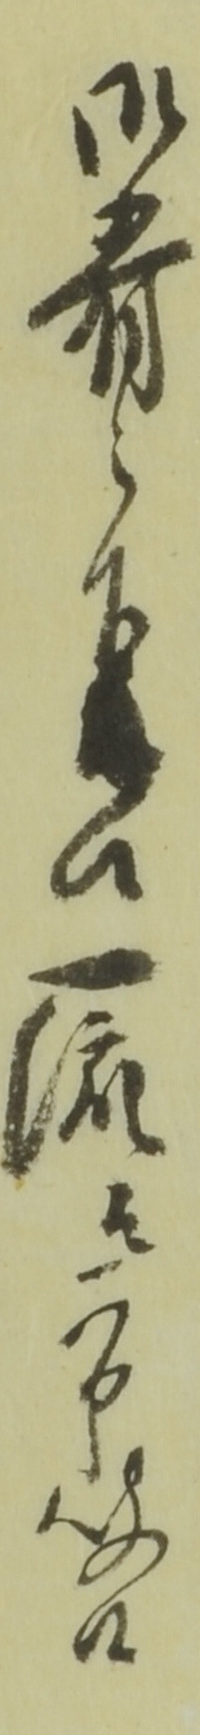御肴被下候一統江可申付候
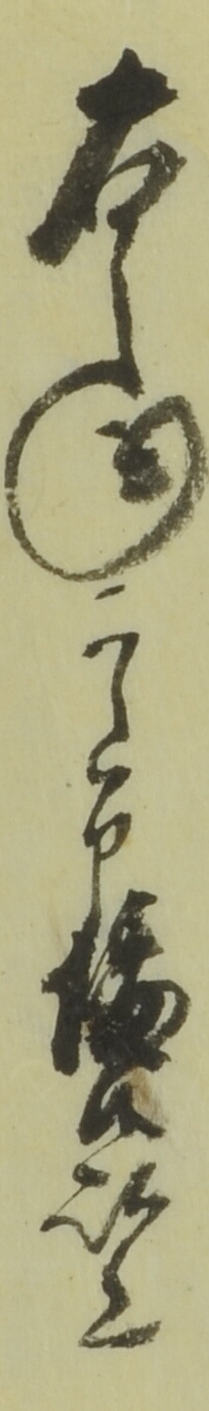右之趣可被申渡候以上
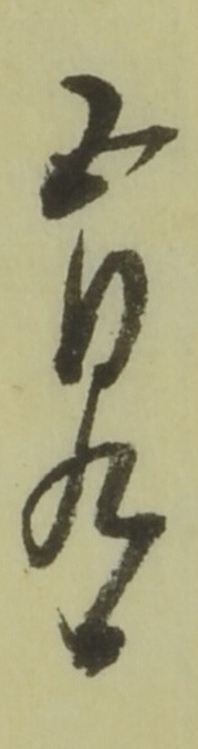五月九日
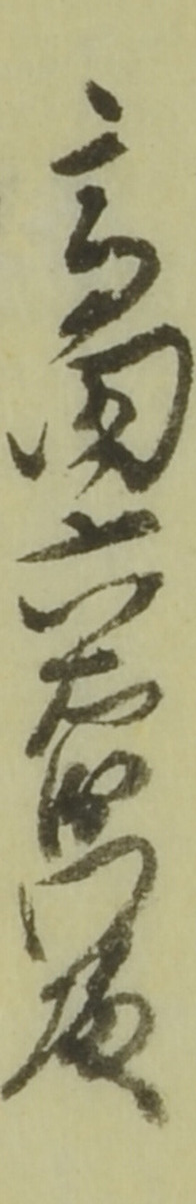高田六右衛門殿
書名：御触書御書附控
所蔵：伊那市立高遠町図書館・合同会社AMANE
